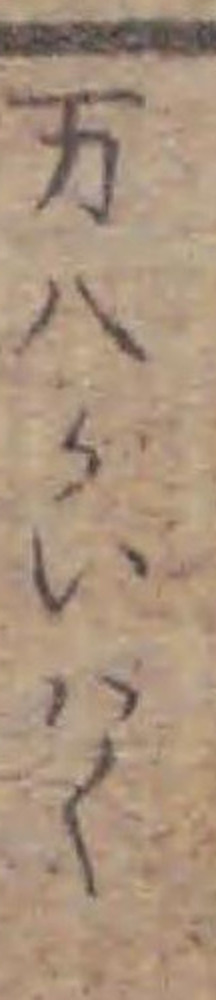万八がいはく
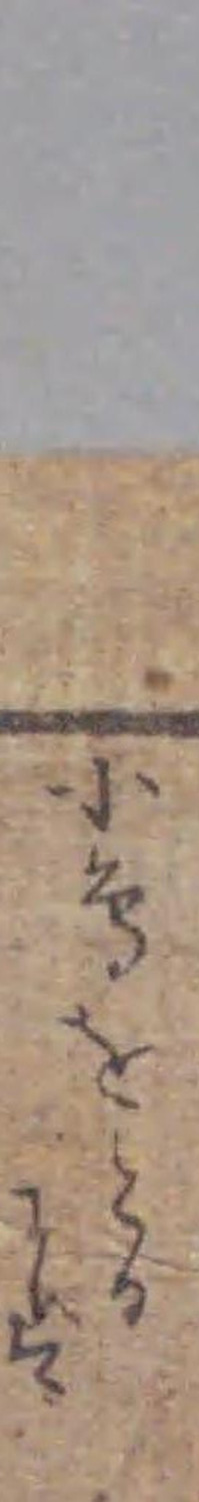小鳥をとる
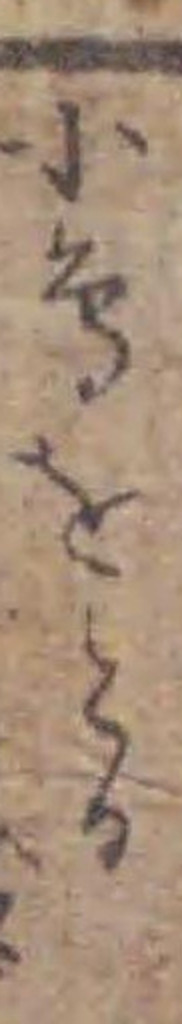小鳥をとる
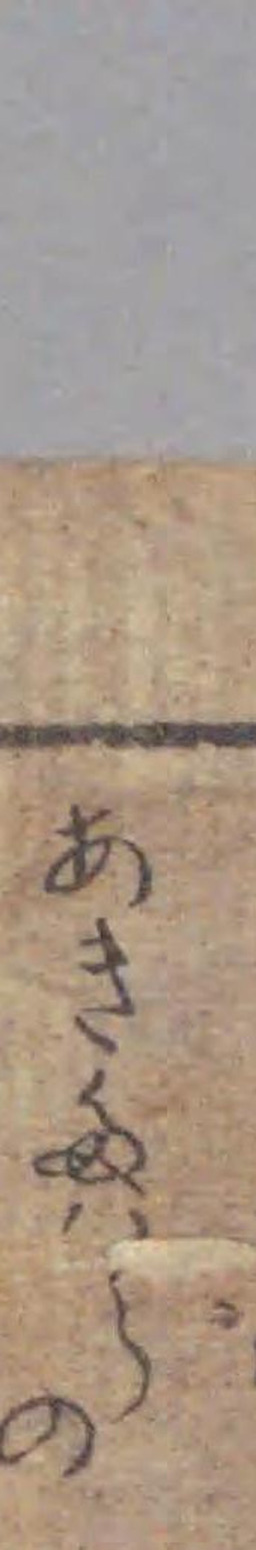あきたはら
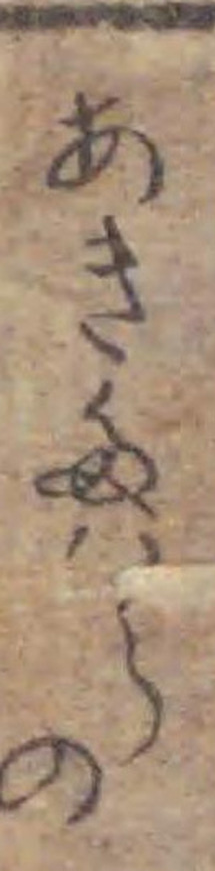あきたはら
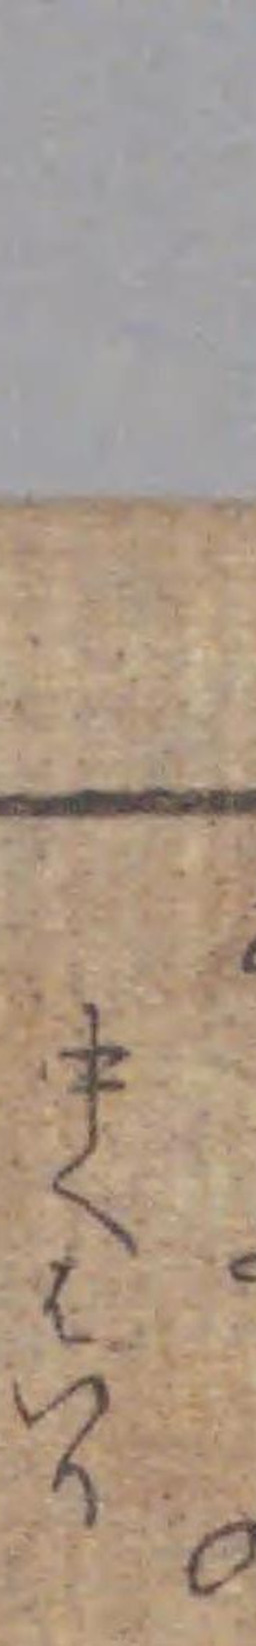中へはいり
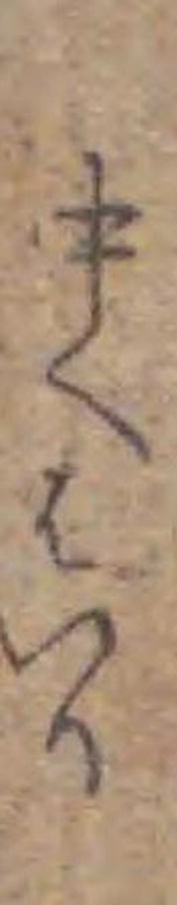中へはいり
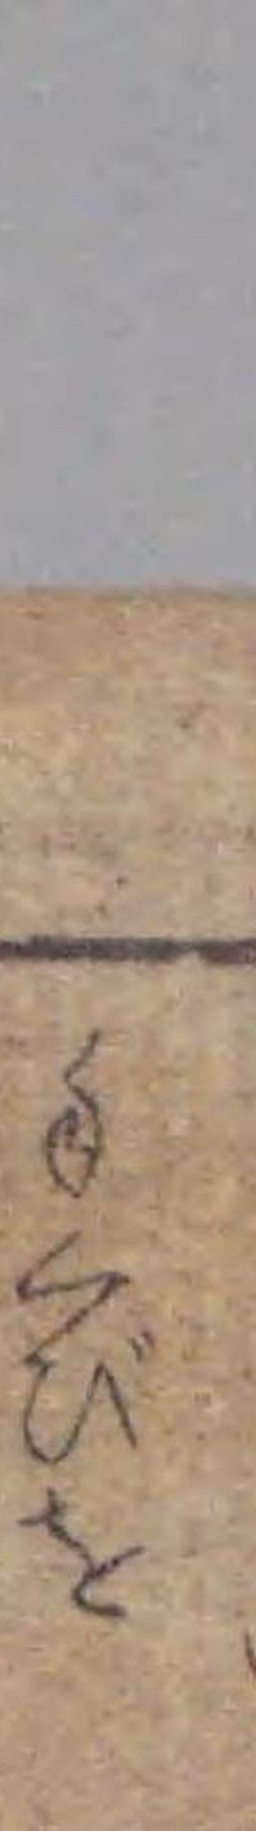手くびを
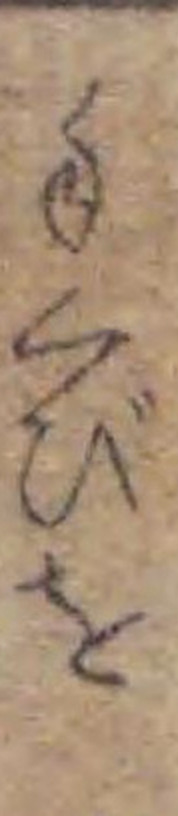手くびを
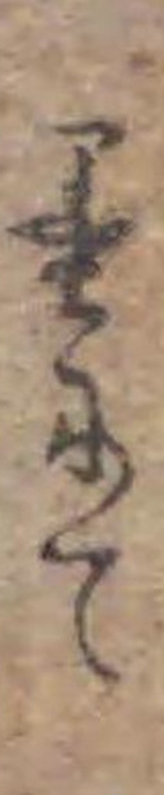墨にて
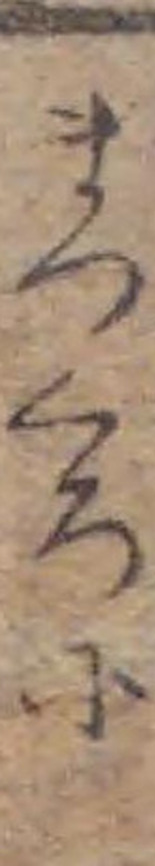まつくろに
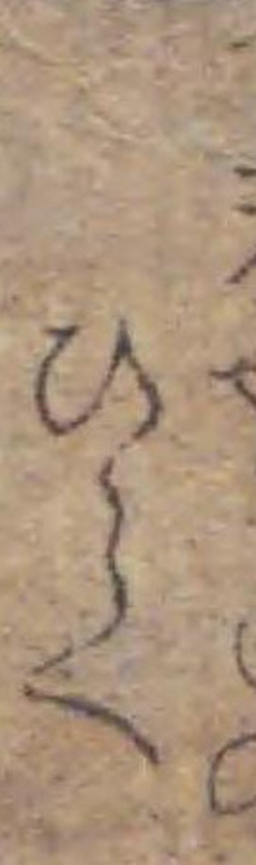ひらへ
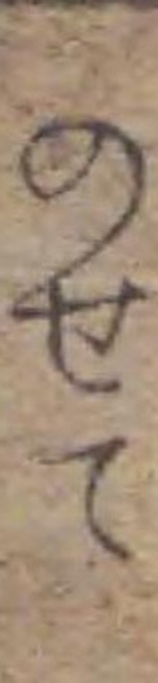のせて
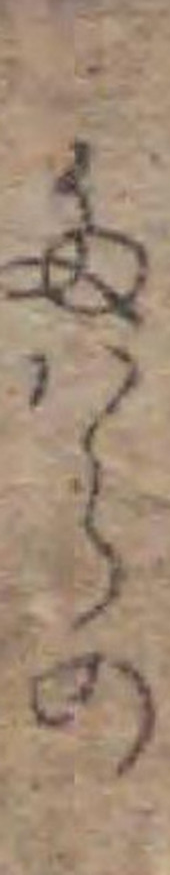たはらの
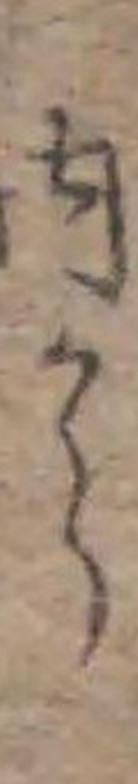内から
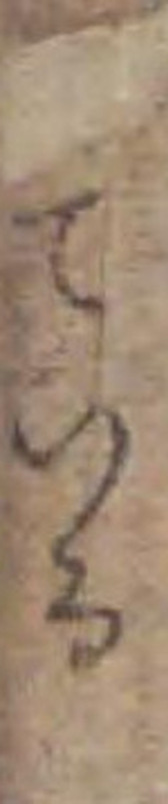ている
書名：虚言八百万八伝 : 3巻
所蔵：国立国会図書館 National Diet Library, JAPAN
